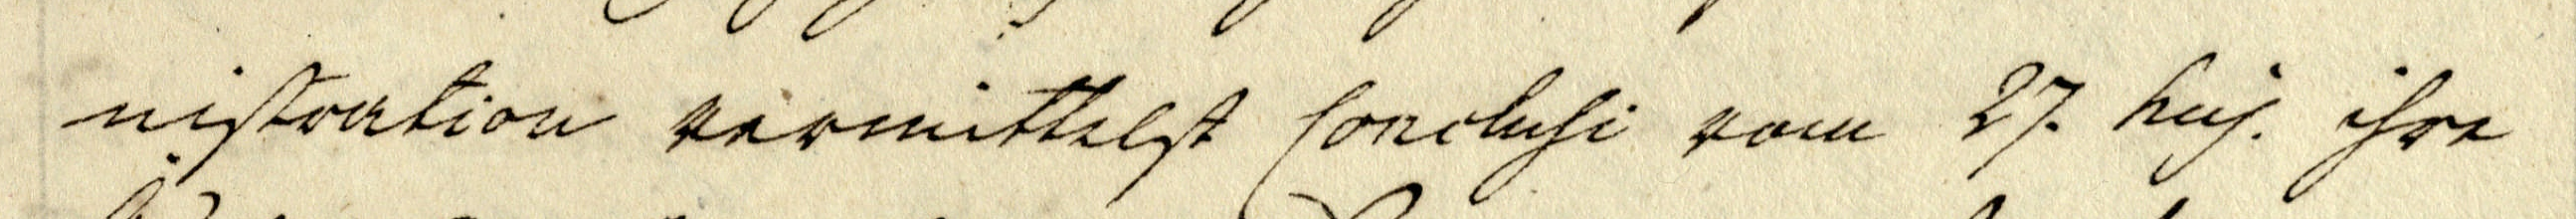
nistration vermittelst Conclusi vom 27. huj. ihre
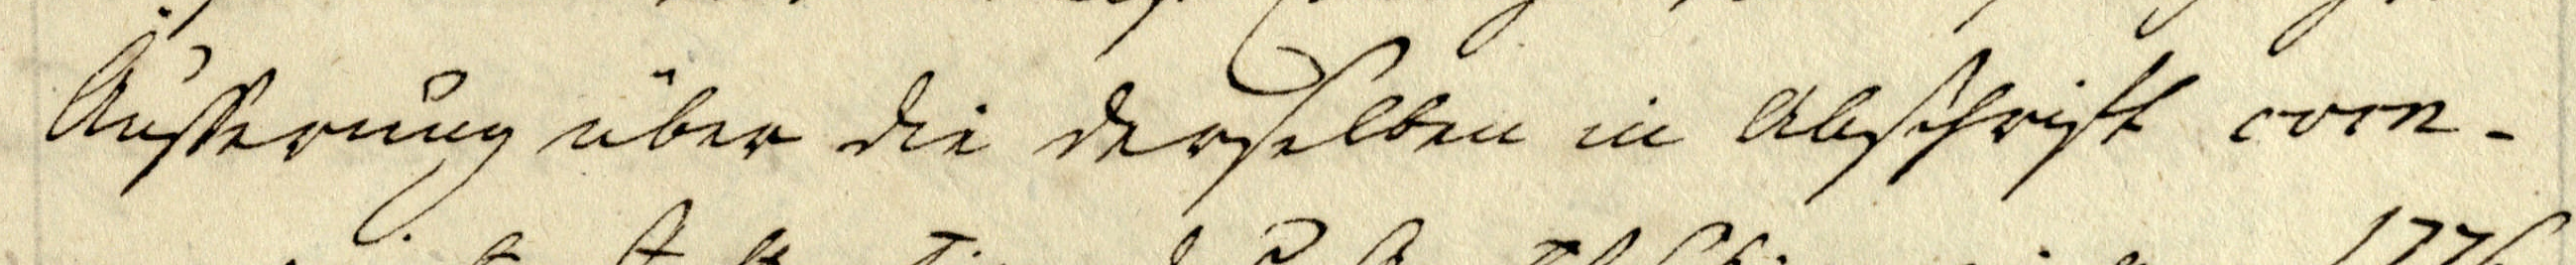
Äusserung über die derselben in Abschrift com¬
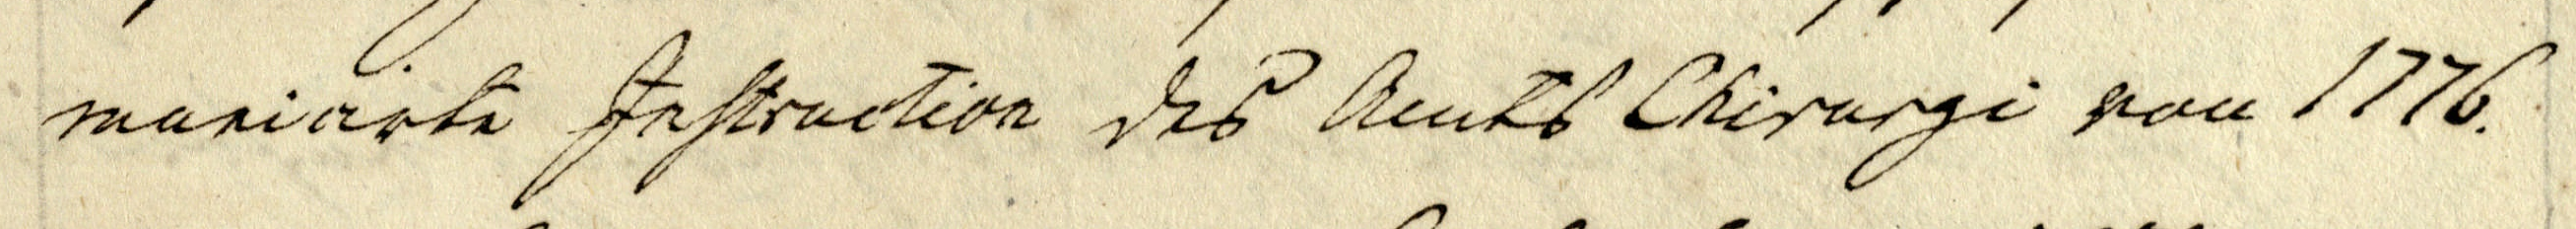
municirte Instruction des Amts Chirurgi von 1776.
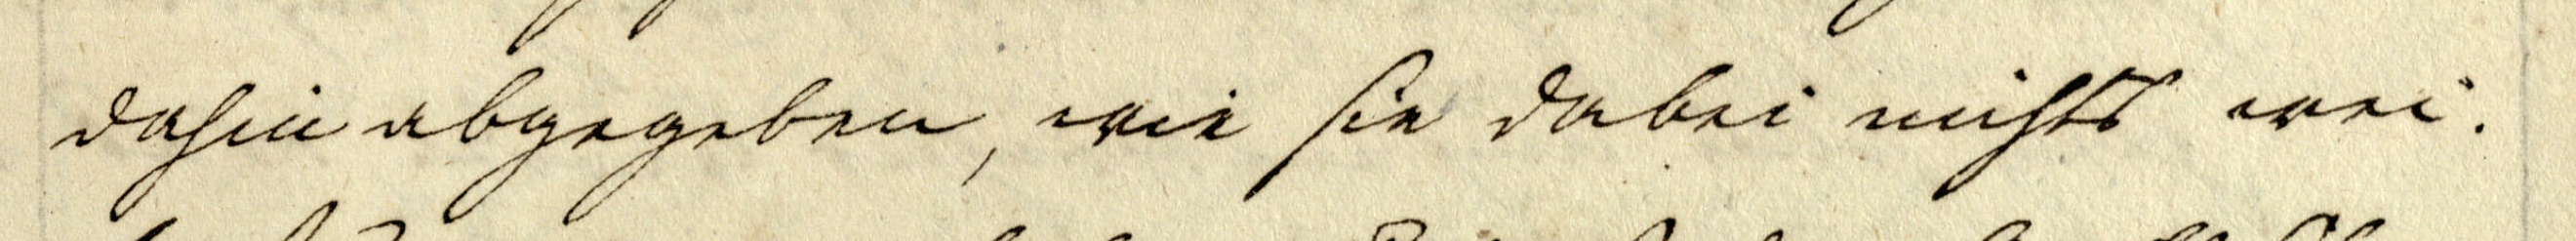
dahin abgegeben, wie sie dabei nichts wei¬
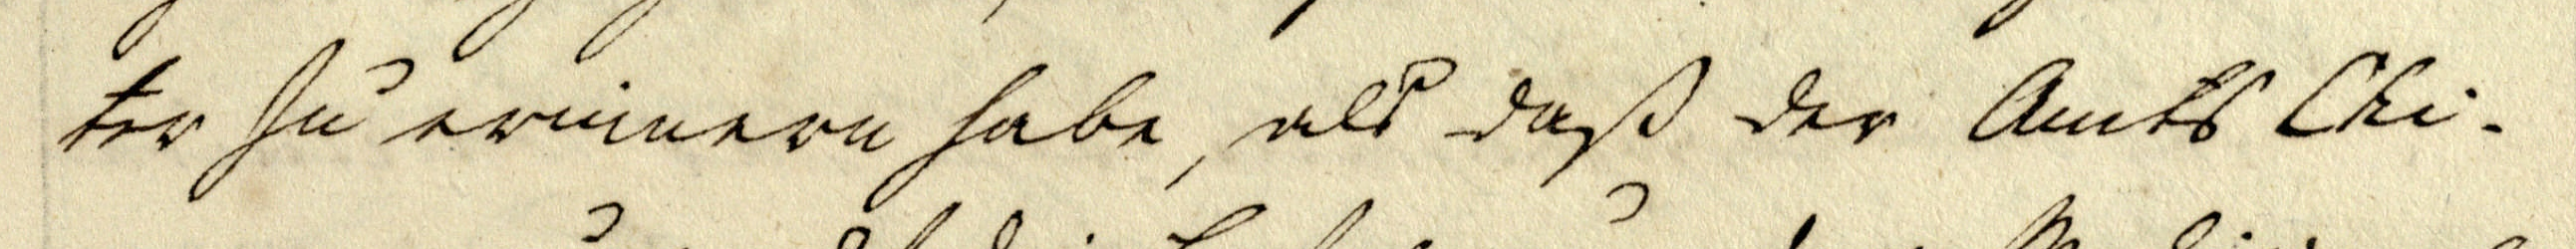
ter zu erinnern habe, als daß der Amts Chi¬
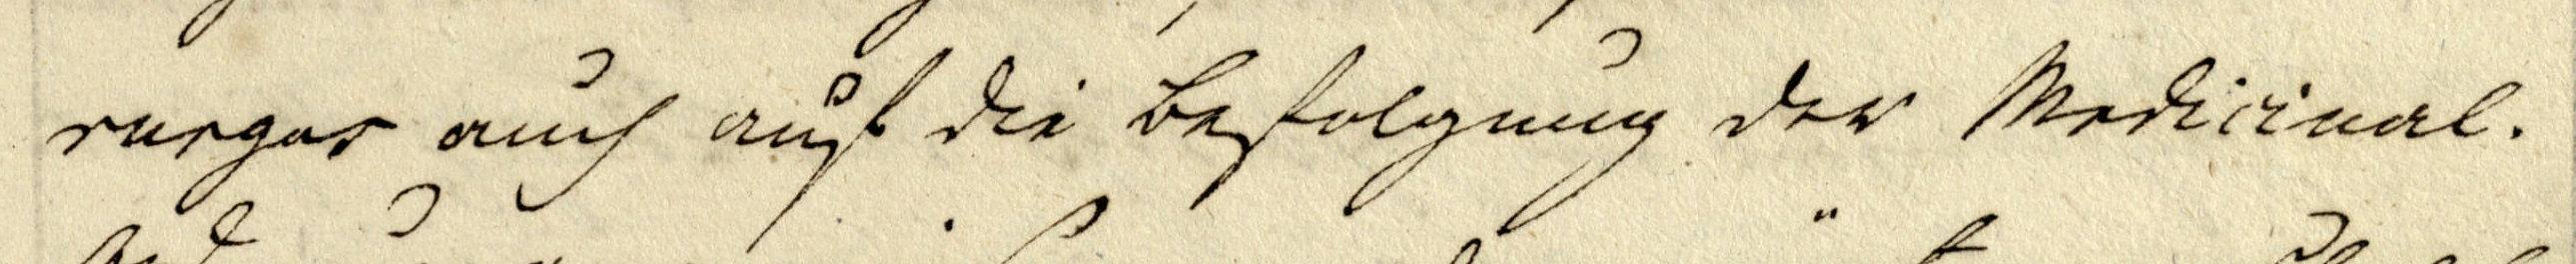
rurgus auch auf die Befolgung der Medicinal¬
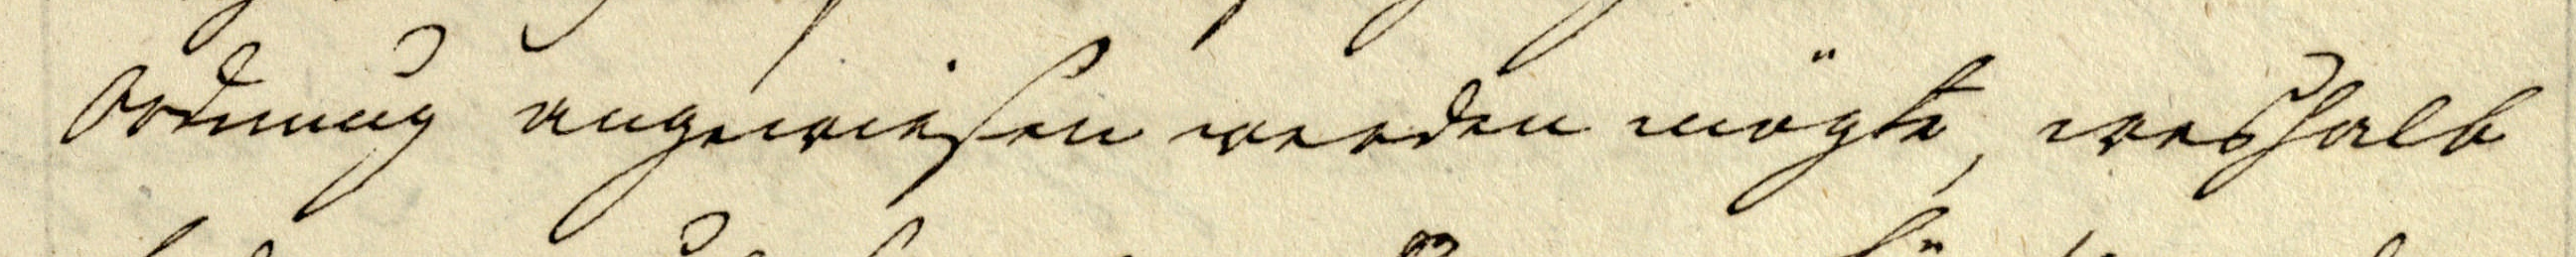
Ordnung angewiesen werden mögte, weshalb
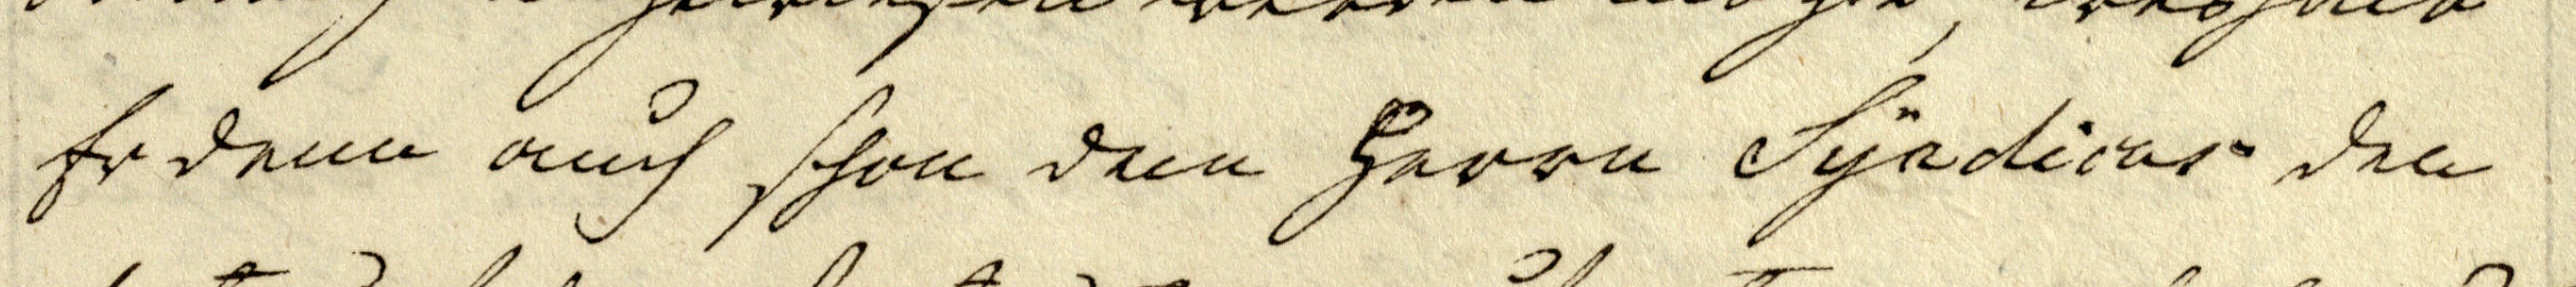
Er denn auch schon dem Herrn Sÿndicus den
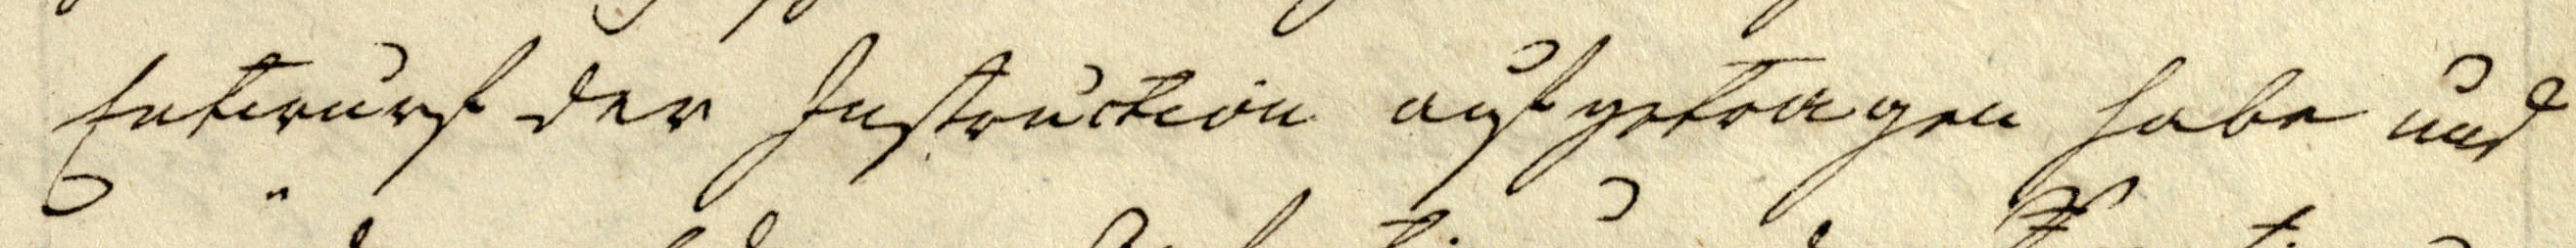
Entwurf der Instruction aufgetragen habe und
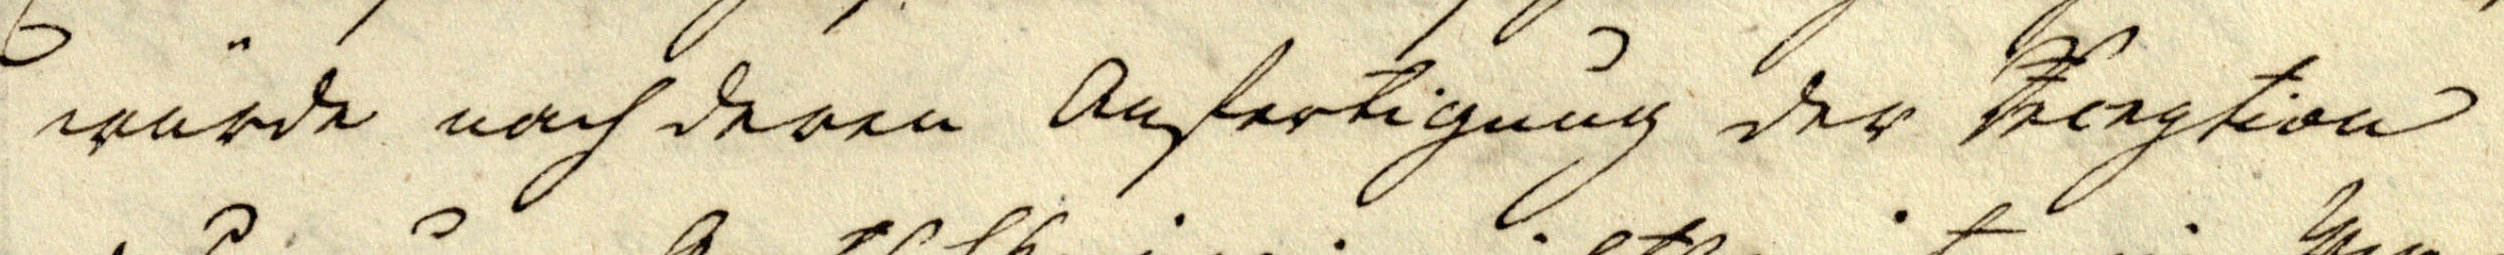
würde nach deren Anfertigung der Reception
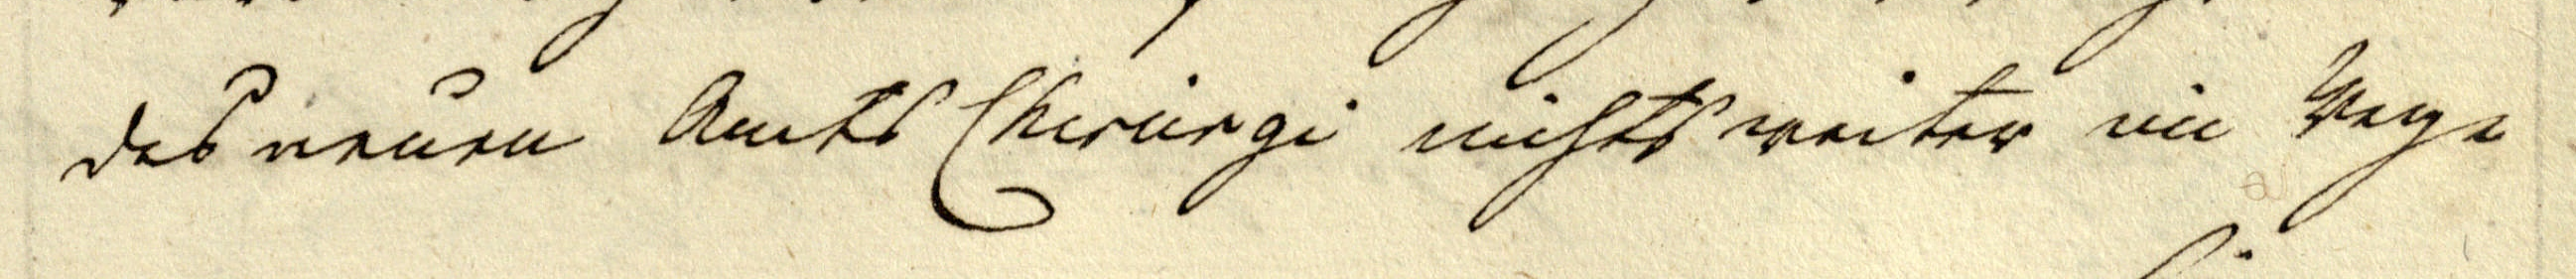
des neuen Amts Chirurgi nichts weiter im Wege
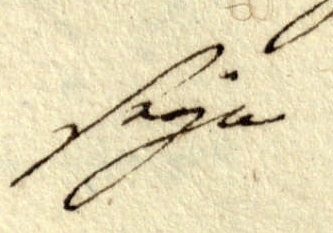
seÿn.
